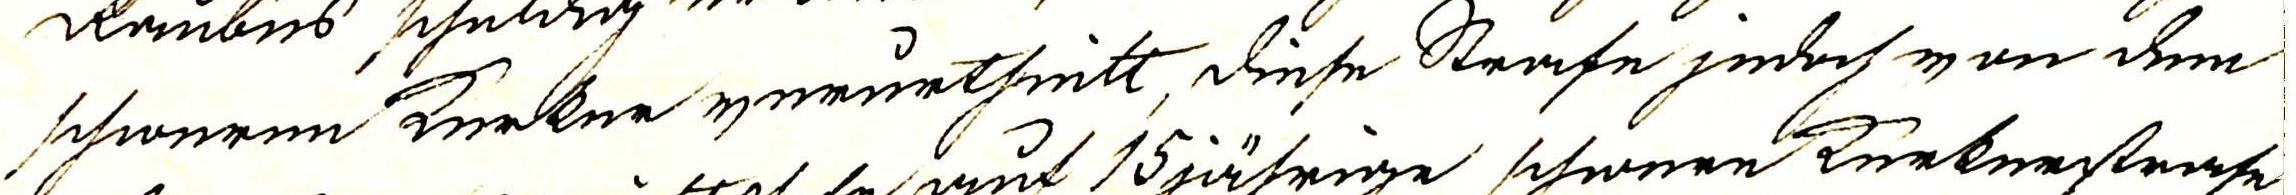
schweren Kerker verurtheilt, diese Strafe jedoch von dem
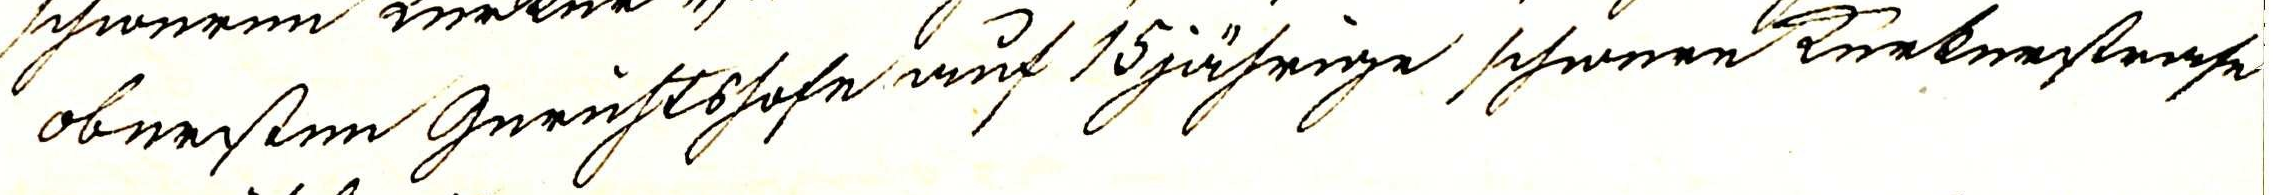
obersten Gerichtshofe auf 15jährige schwere Kerkerstrafe
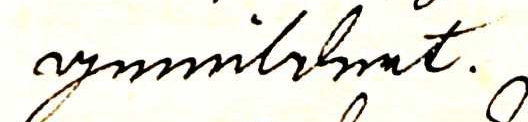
gemildert.
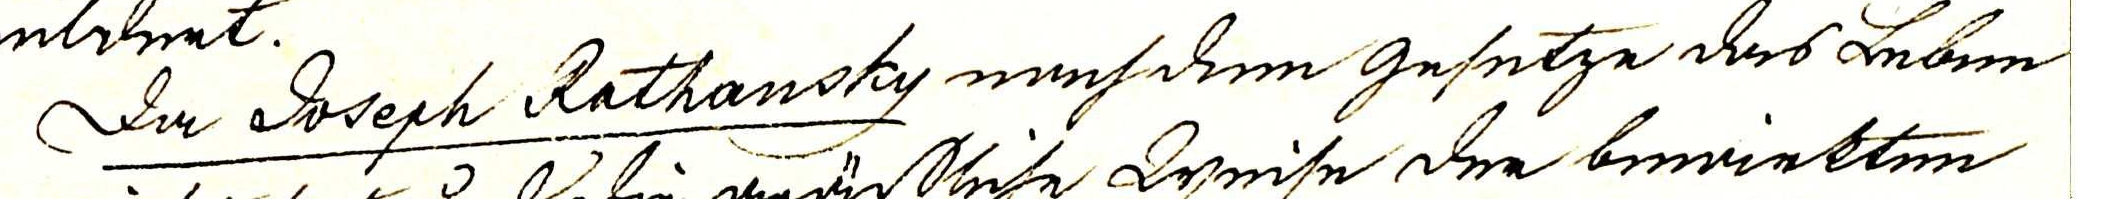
Da Joseph Rathansky nach dem Gesetze das Leben
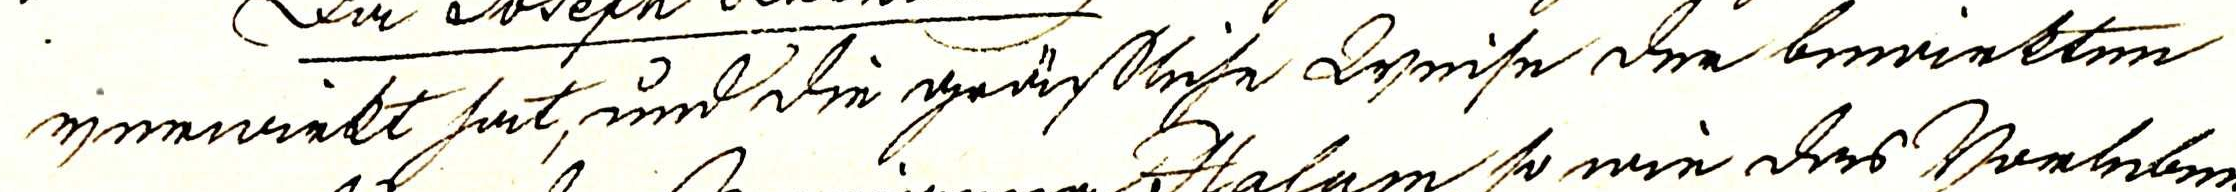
verwirkt hat, und die gräßliche Weise der bewirkten
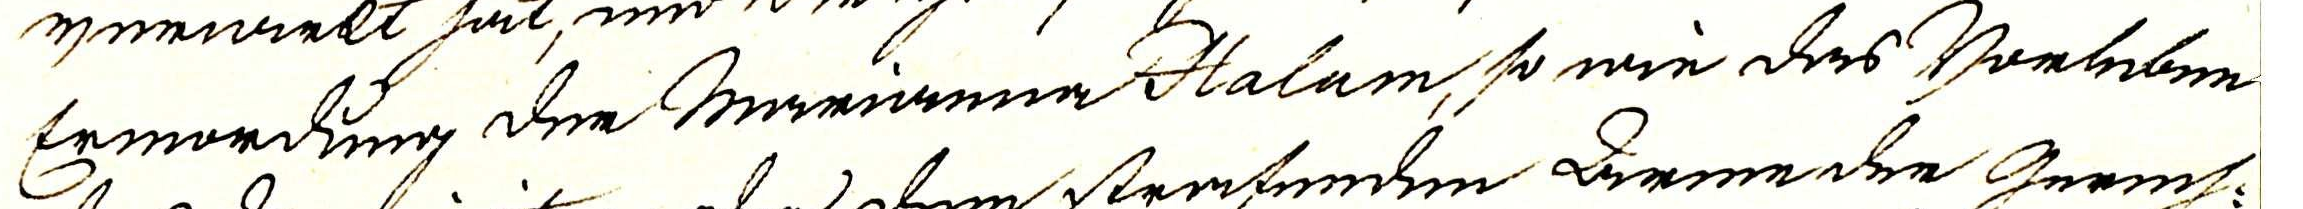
Ermordung der Marianna Halam, so wie das Vorleben
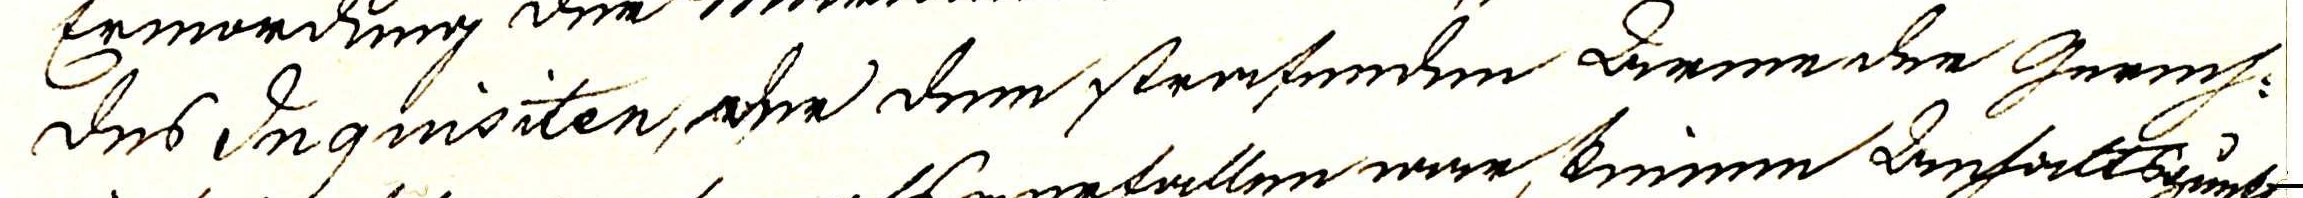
des Inquisiten, der dem strafenden Arme der Gerech¬
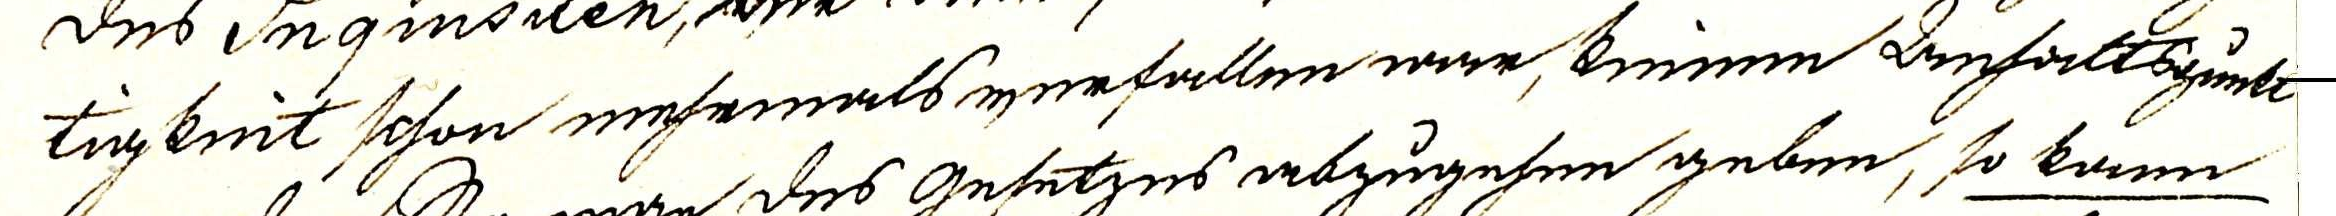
tigkeit schon mehrmals verfallen war, keinen Anhalfspunkt
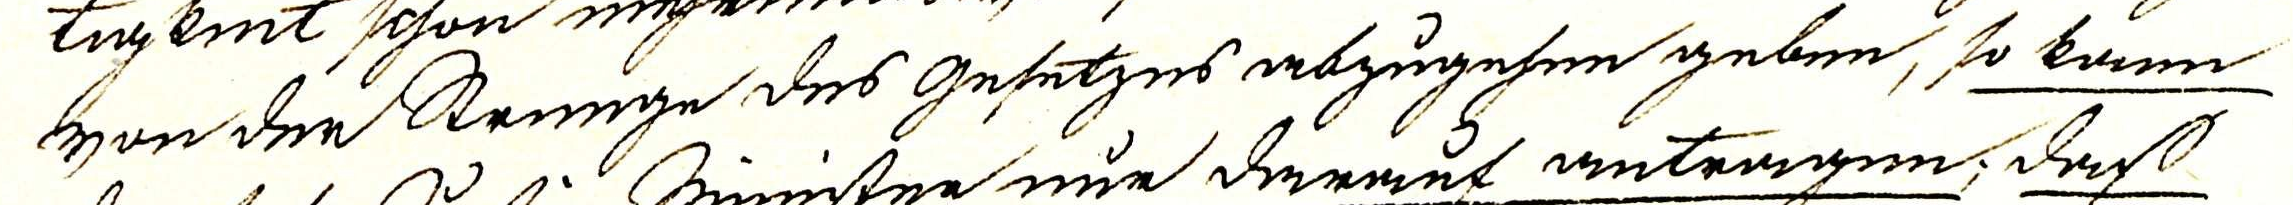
von der Strenge des Gesetzes abzugehen geben, so kann
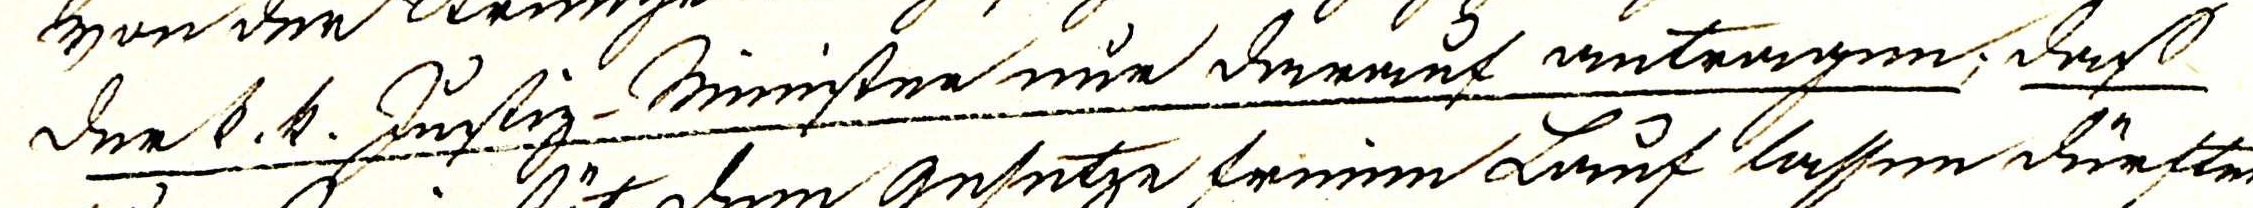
der k.k. Justiz-Minister nur darauf antragen; daß
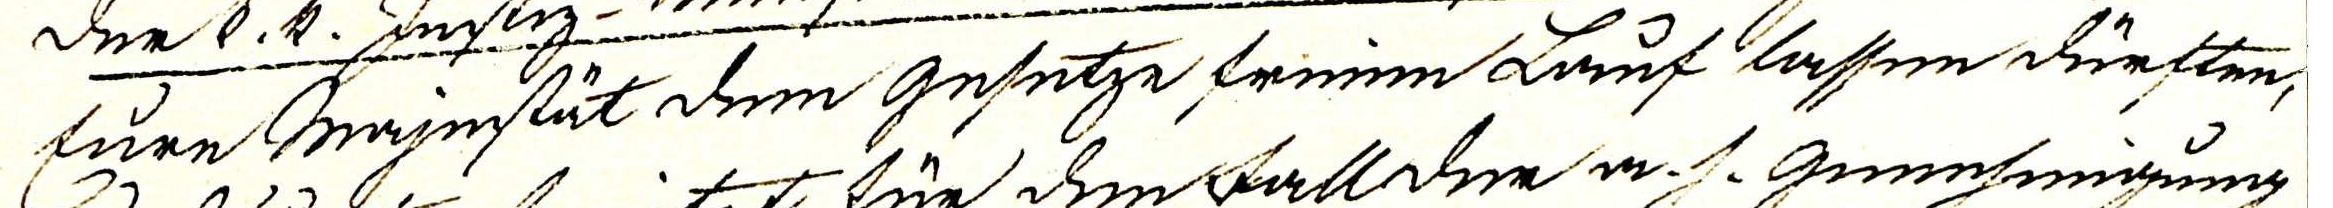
Euer Majestät dem Gesetze freien Lauf lassen dürften,
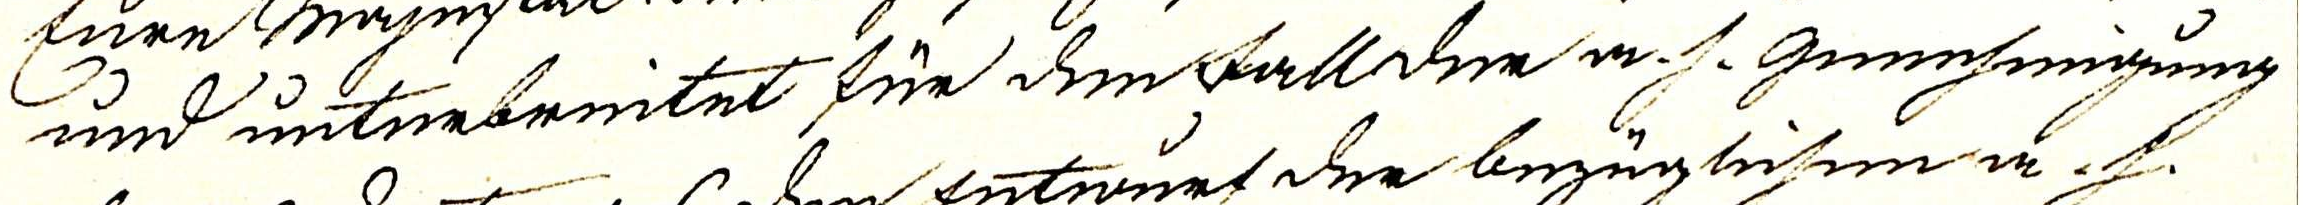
und unterbreitet für den Fall der a.h. Genehmigung
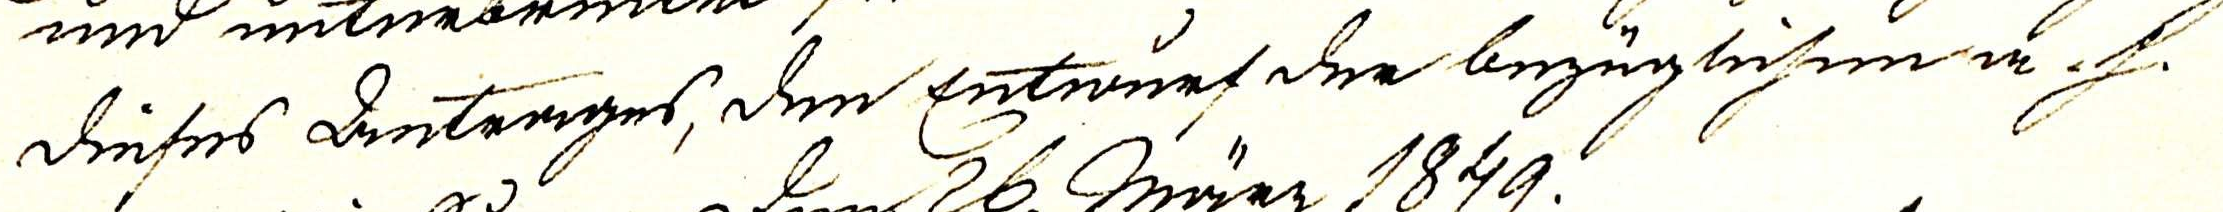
dieses Antrages, den Entwurf der bezüglichen a.h.
